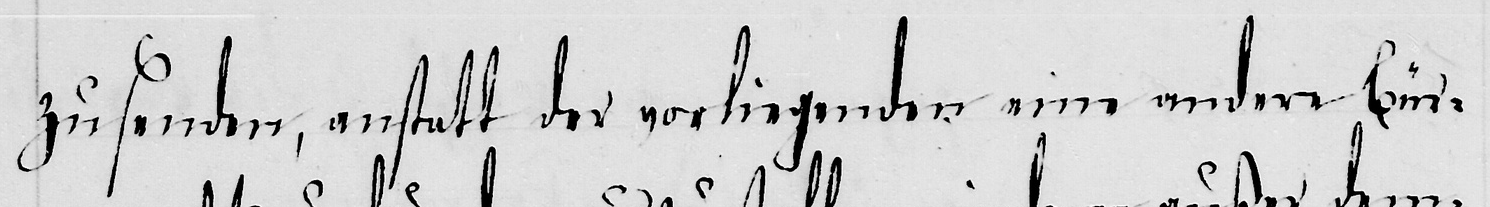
zusenden, anstatt der vorliegenden eine andere Bür¬
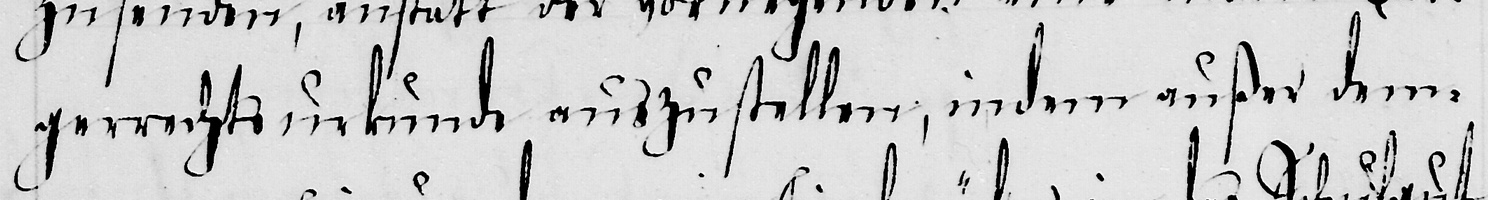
gerrechtsurkunde auszustellen, indem außer dem¬
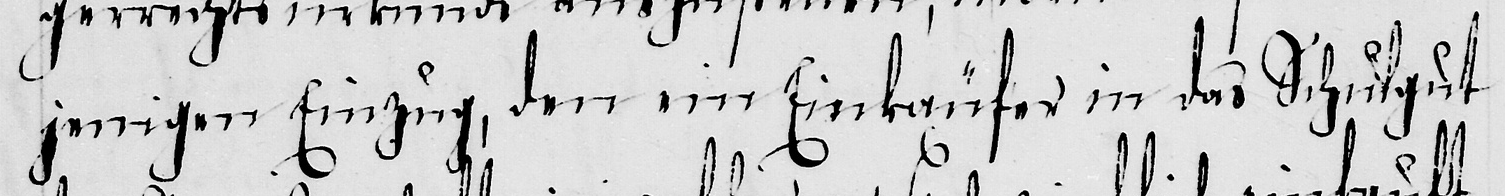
jenigen Einzug, den ein Einkäufer in das Schulgut
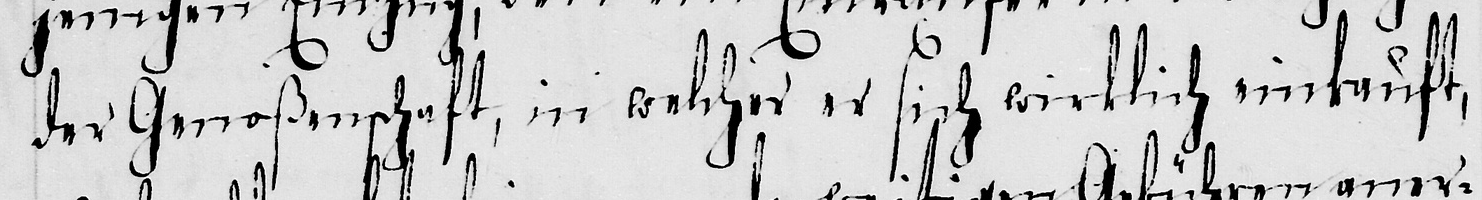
der Genoßenschaft, in welcher er sich wirklich einkauft,
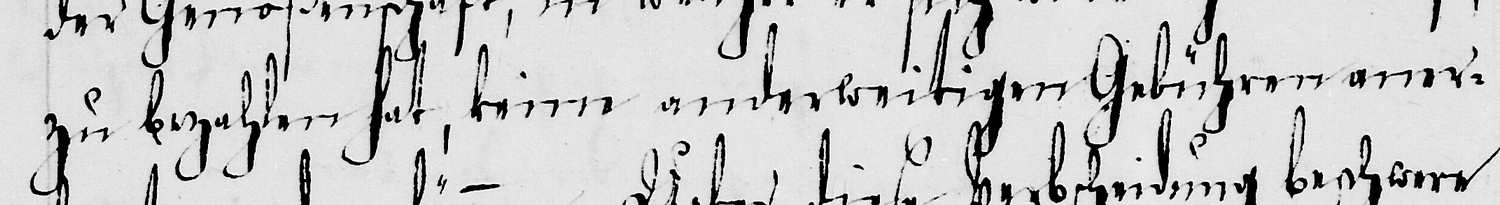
zu bezahlen hat, keine anderweitigen Gebühren aner¬
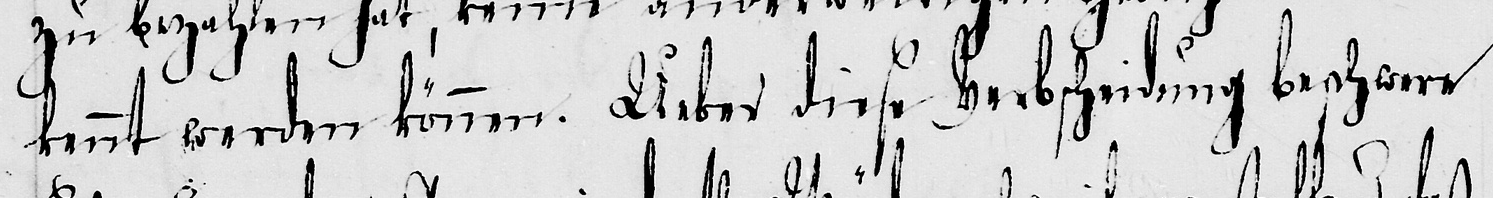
kennt werden können. Ueber diese Verbscheidung beschwere
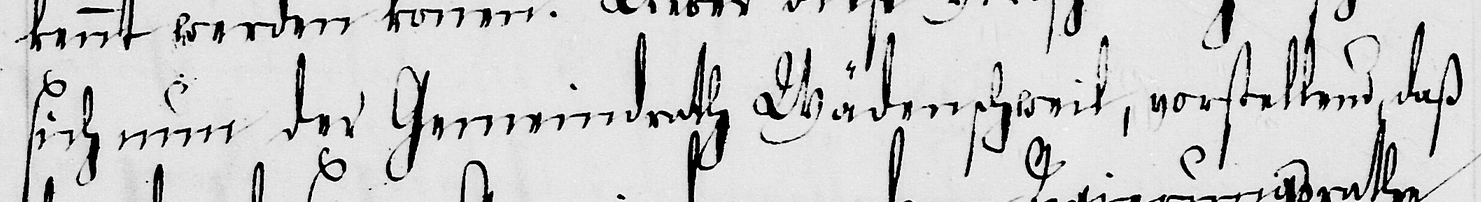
sich nun der Gemeindrath Wädenschweil, vorstellend,
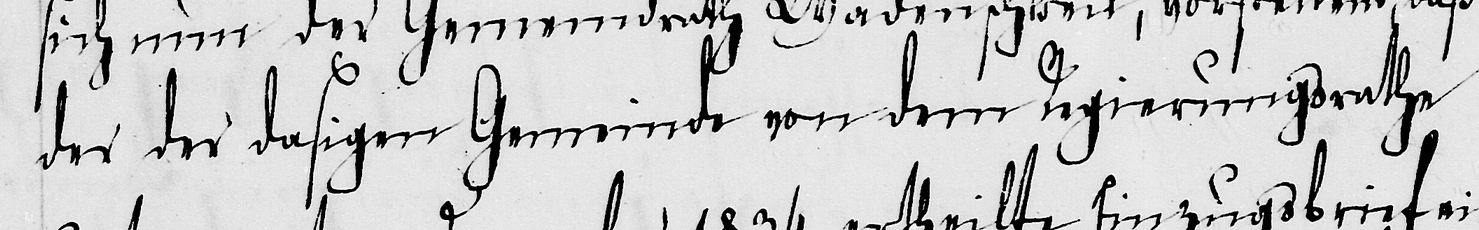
der der dasigen Gemeinde von dem Regierungsrathe
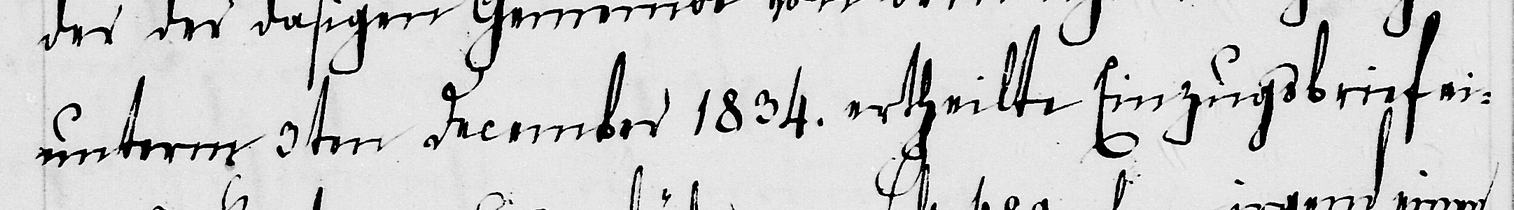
unterm 3ten December 1834. ertheilte Einzugsbrief ei¬
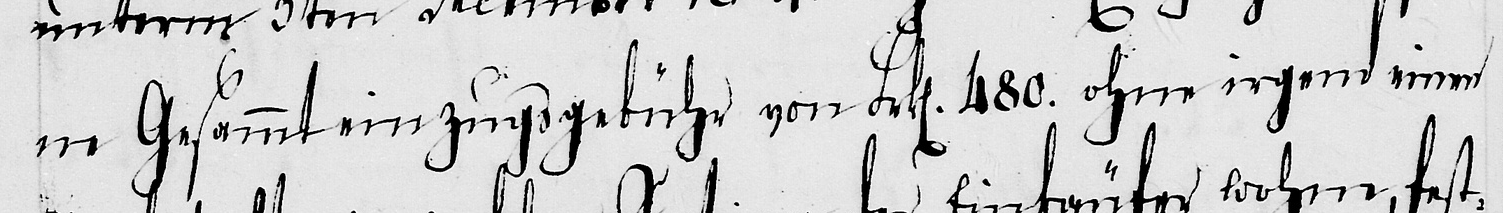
ne Gesammteinzugsgebühr von Frk[en]. 480. ohne irgend einen
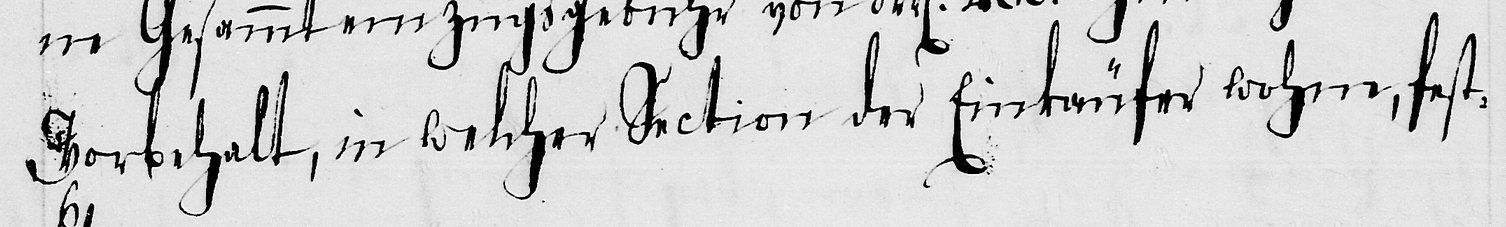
Vorbehalt, in welcher Section der Einkäufer wohne, fest¬
